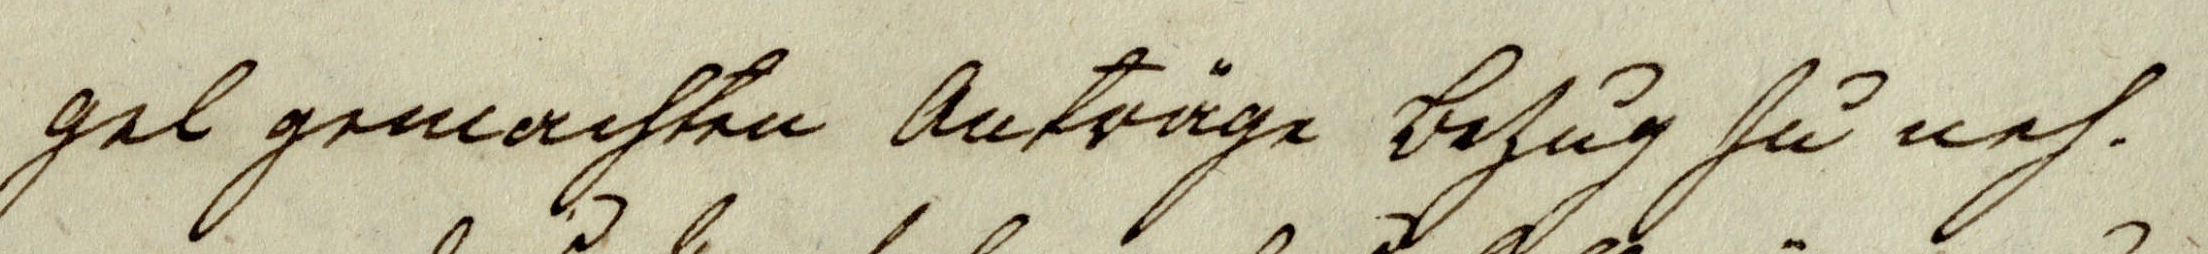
gel gemachten Anträge Bezug zu neh¬
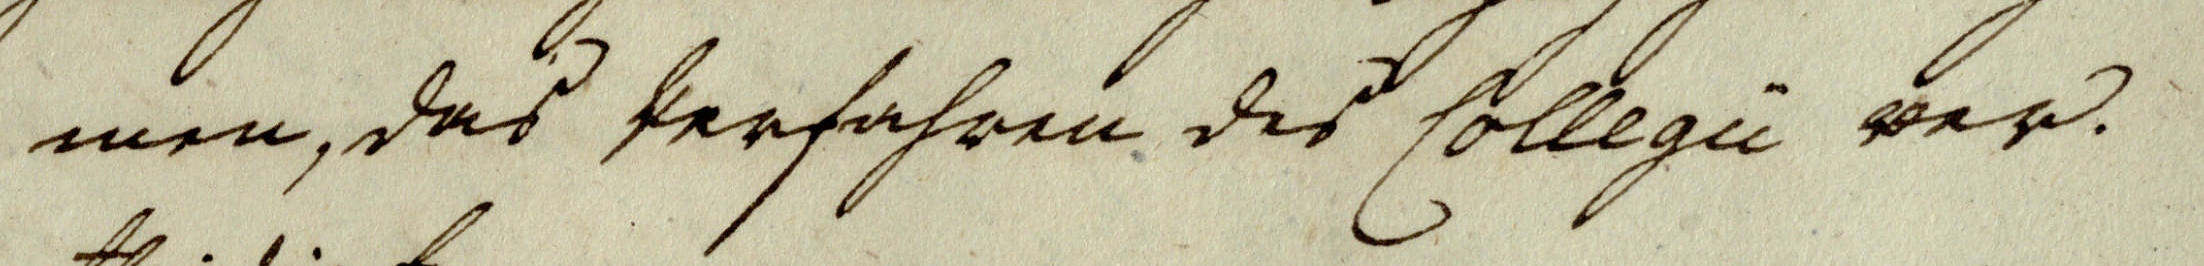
men, das Verfahren des Collegii ver¬
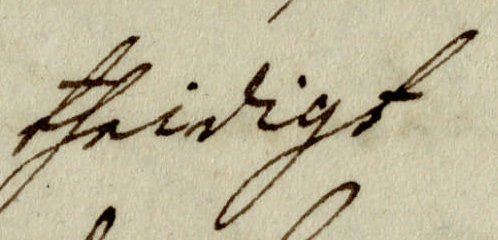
theidigt
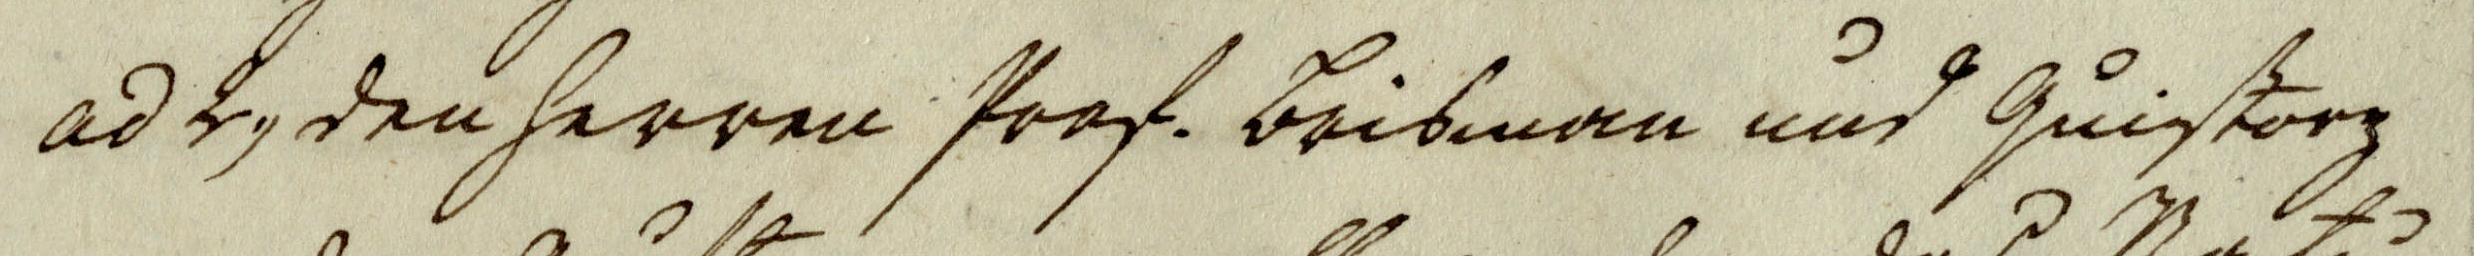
ad 2., den Herren Prof. Brisman und Quistorp
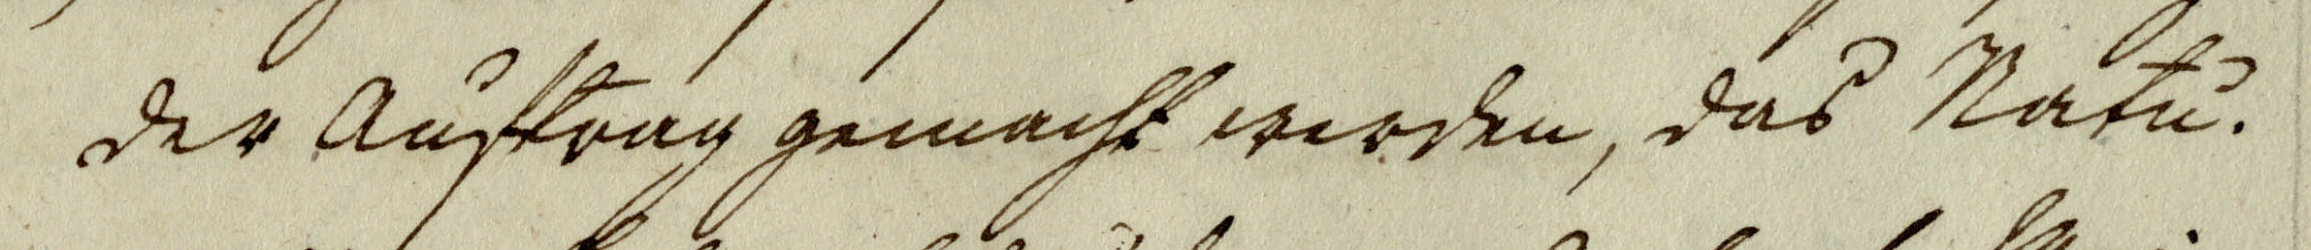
der Auftrag gemacht werden, das Natu¬
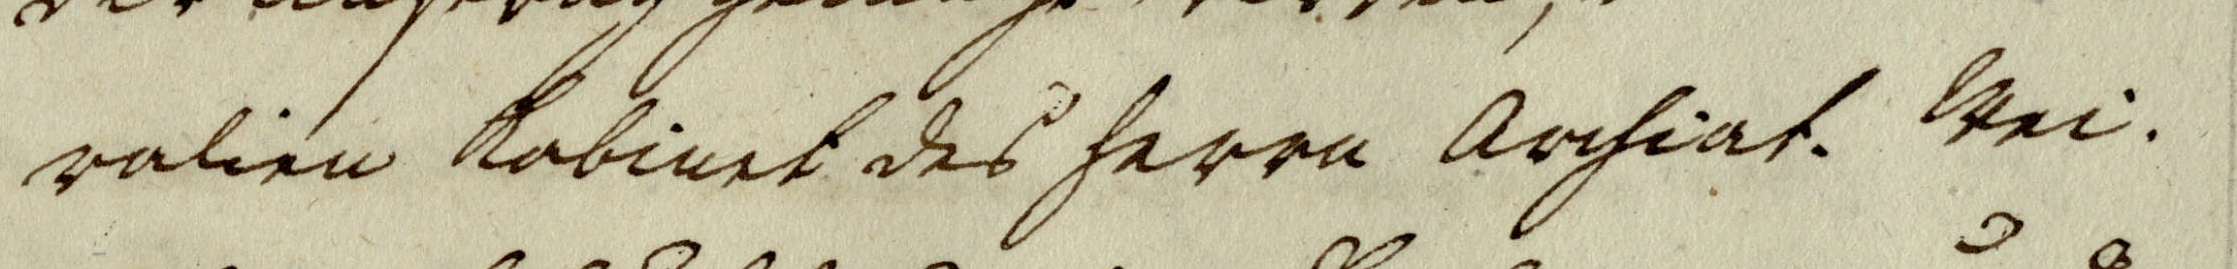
ralien Kabinet des Herrn Archiat. Wei¬
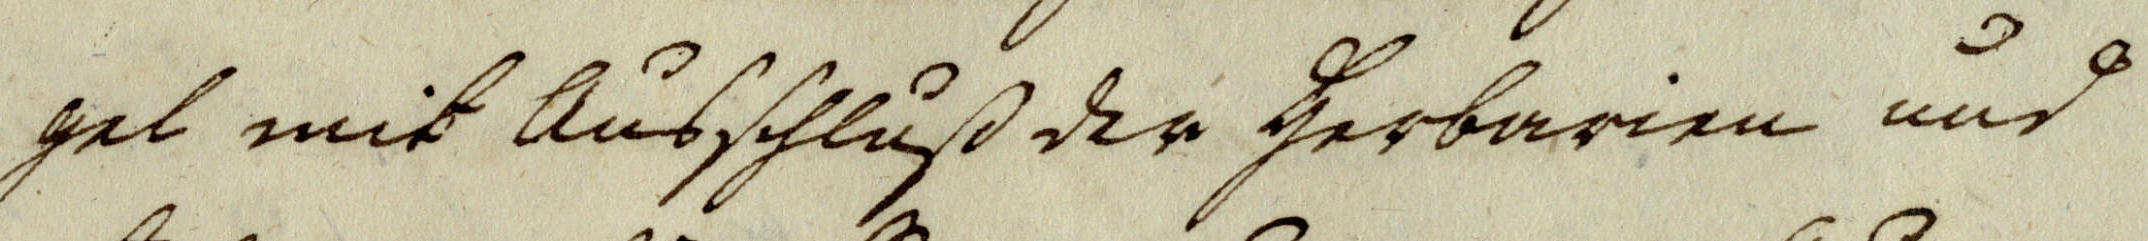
gel mit Ausschluß der Herbarien und
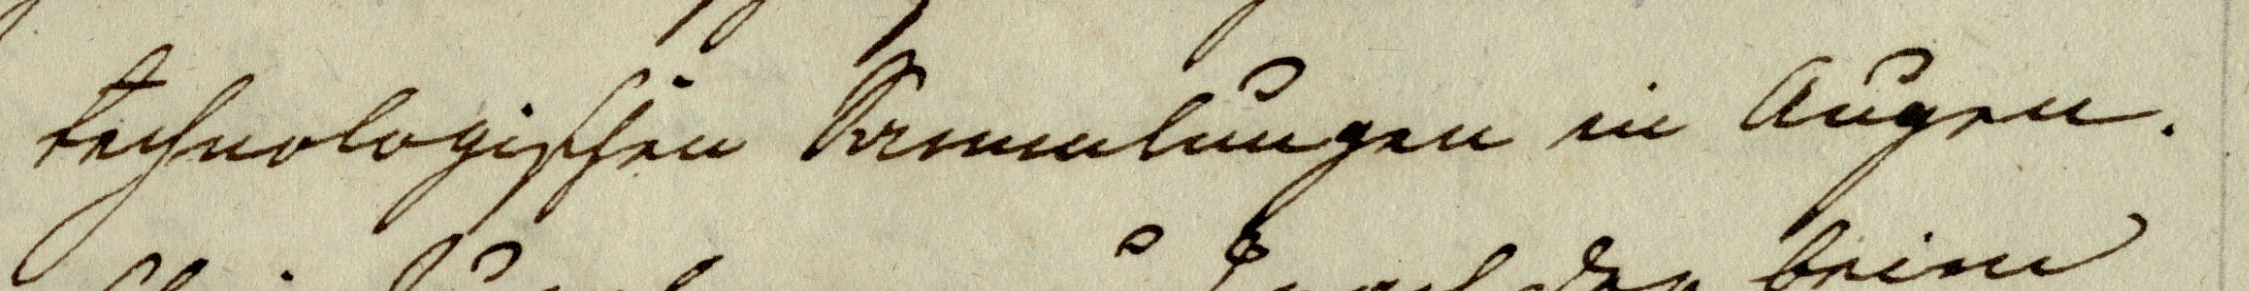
technologischen Sammlungen in Augen¬
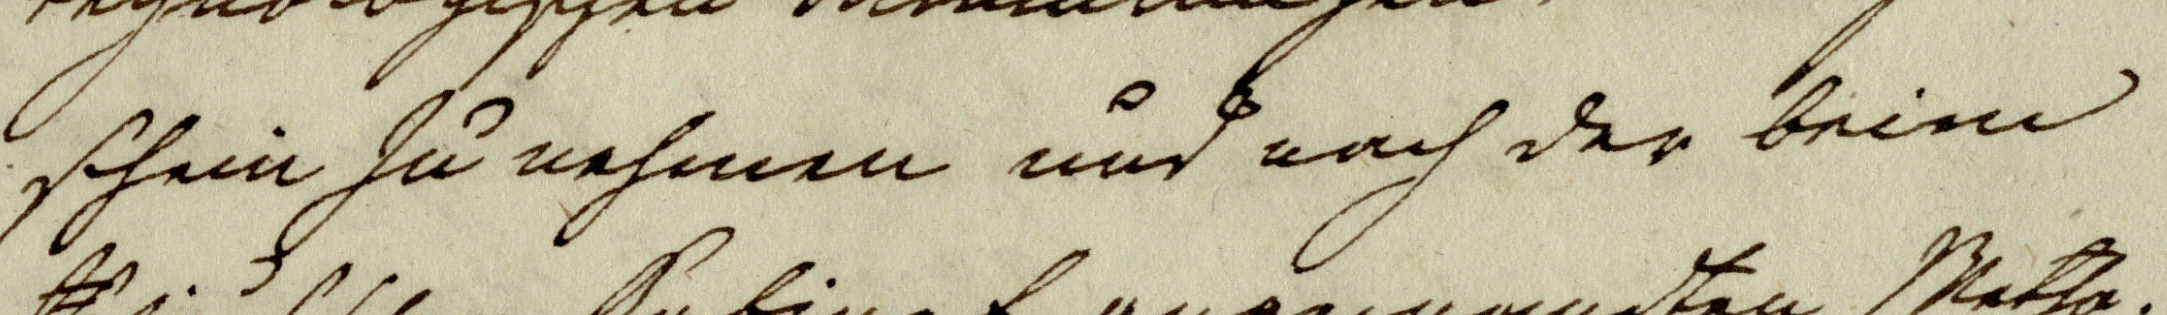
schein zu nehmen und nach der beim
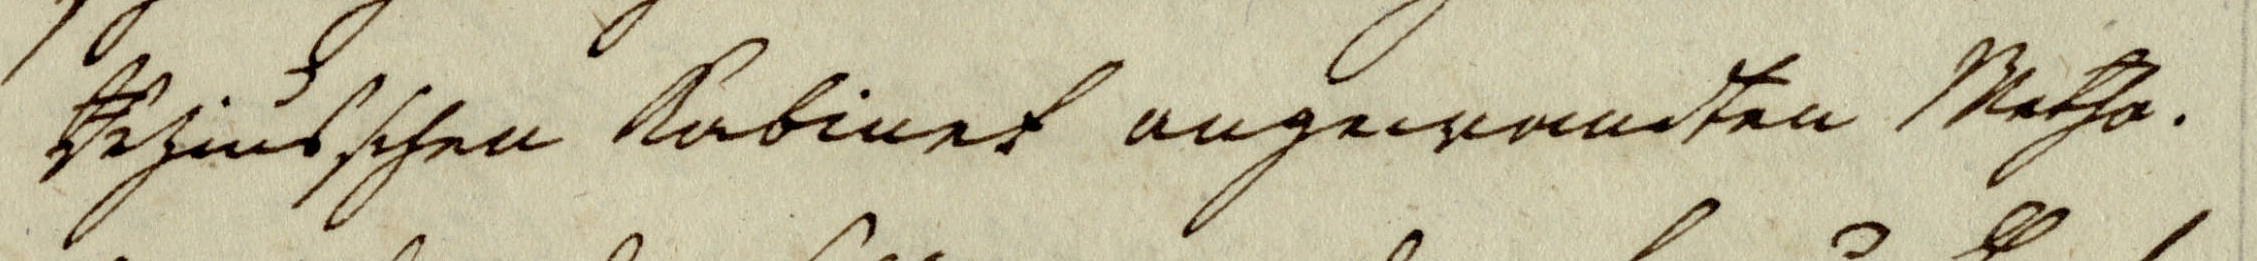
Reziusschen Kabinet angewandten Metho
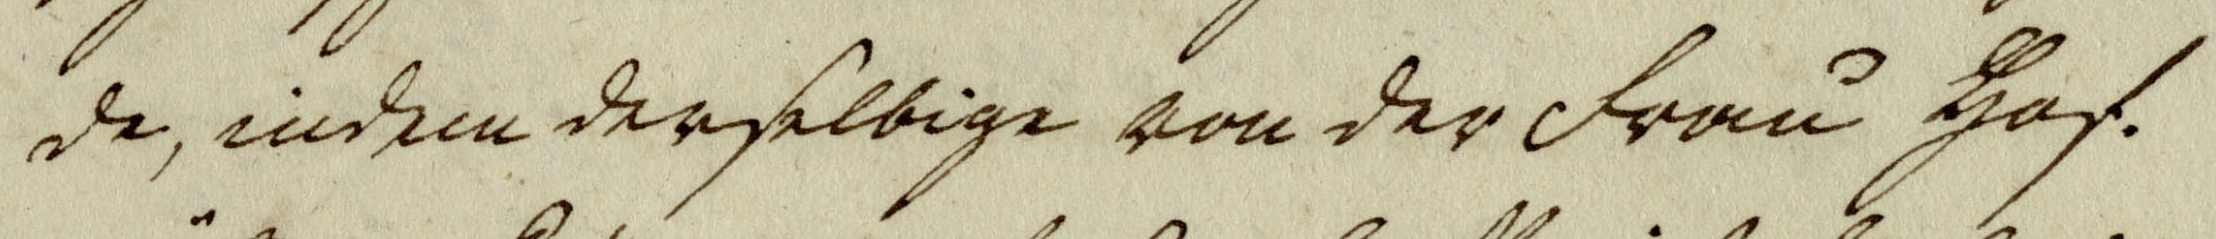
de, indem derselbige von der Frau Hof¬
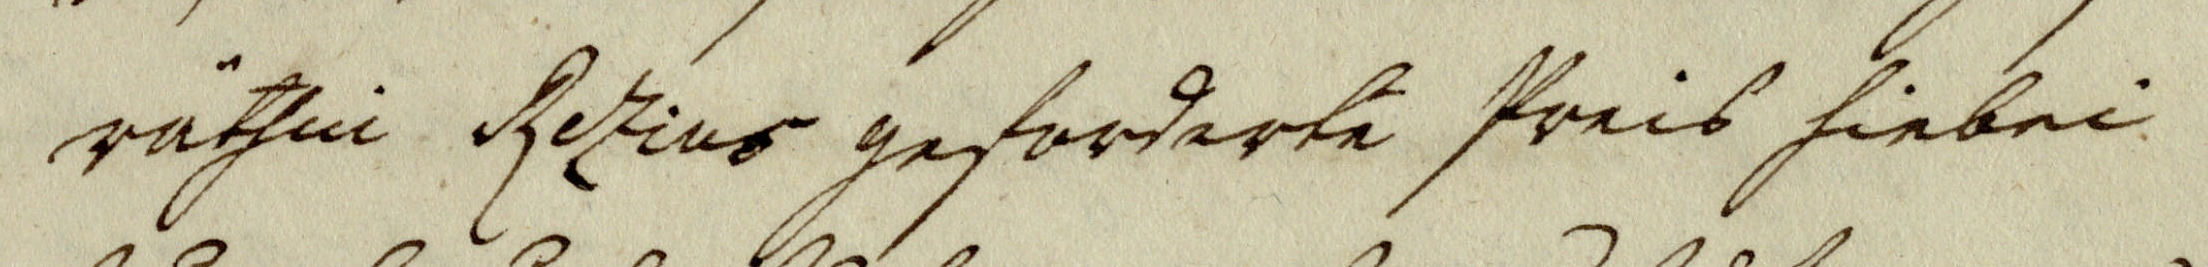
räthin Rezius geforderte Preis hiebei
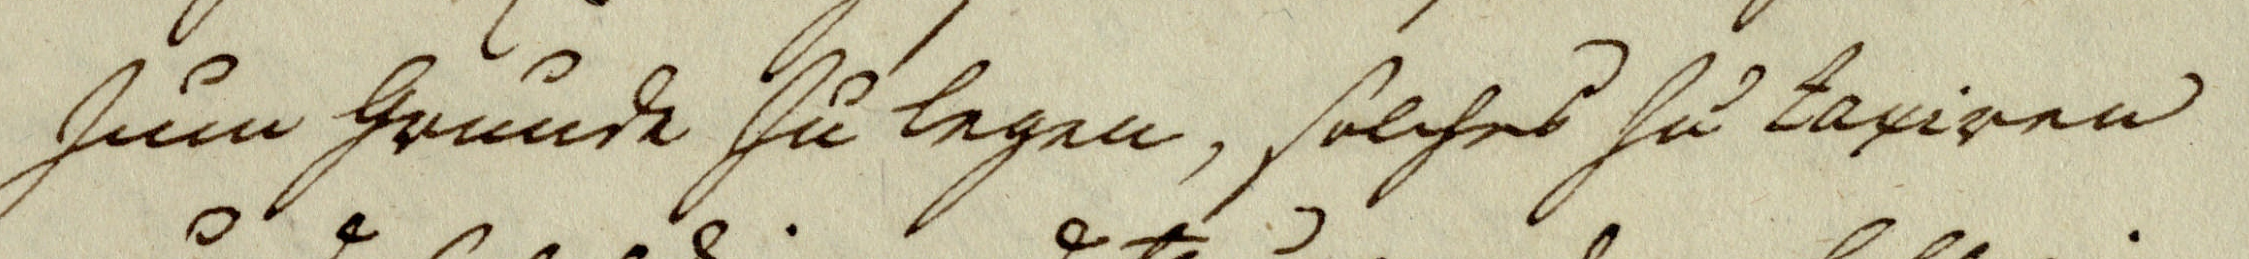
zum Grunde zu legen, solches zu taxiren
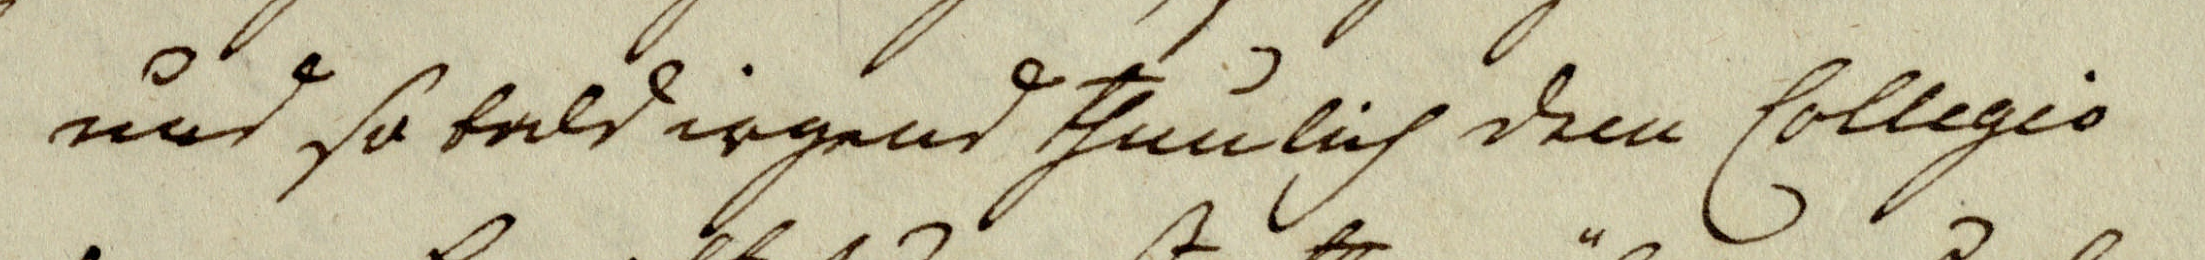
und so bald irgend thunlich dem Collegio
